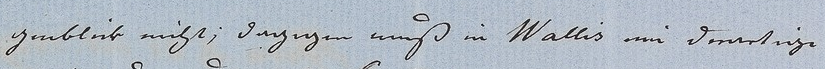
genblick nicht; dagegen muß im Wallis eine derartige
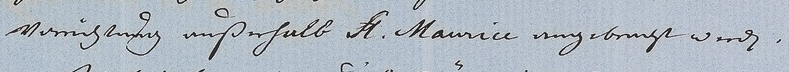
Vorrichtung außerhalb St. Maurice angebracht werden. –
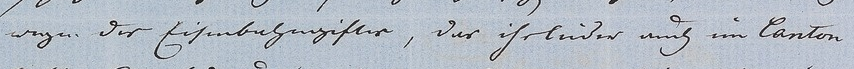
wegen des Eisenbahngiftes, das ihr leider auch im Canton
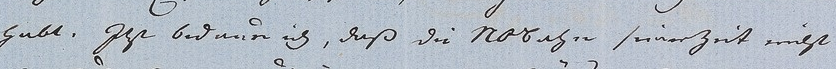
habt. Jetzt bedaure ich, daß die NOBahn seiner Zeit nicht
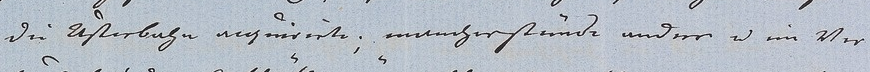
die Usterbahn requirirte; manches stünde anders u ein Ver-
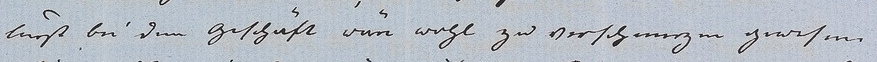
lurst bei dem Geschäft wäre wohl zu verschmerzen gewesen.
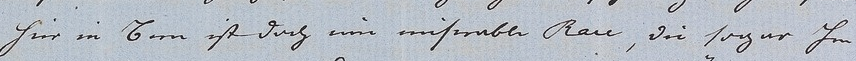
Hier in Bern ist eine miserable Race, die sogar Hrn
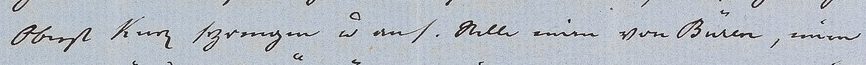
Oberst Kurz sprengen und an s. Stelle einen von Büren, einen
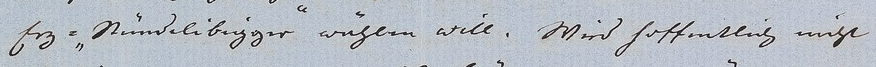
Erz-«Stündelibigger» wählen will. Wird hoffentlich nicht
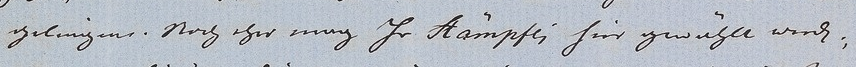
gelingen. Noch eher mag Hr Stämpfli hier gewählt werden;
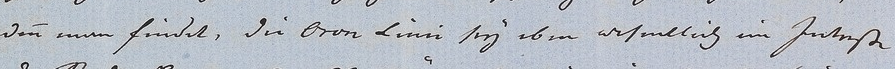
denn man findet, die Oron Linie sey eben wesentlich im Intresse
